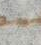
nichts
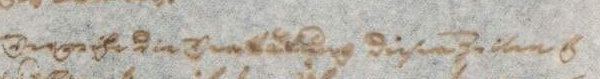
Verzeihe die Verspätung dieser Zeilen &
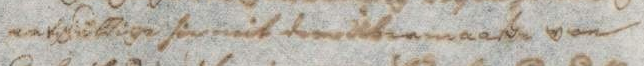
entschuldige hiemit dem Übermaaße von
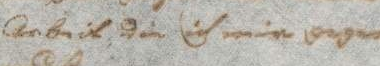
Arbeit, die ich mir gegenwärtig
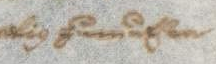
Mit herzlichem
